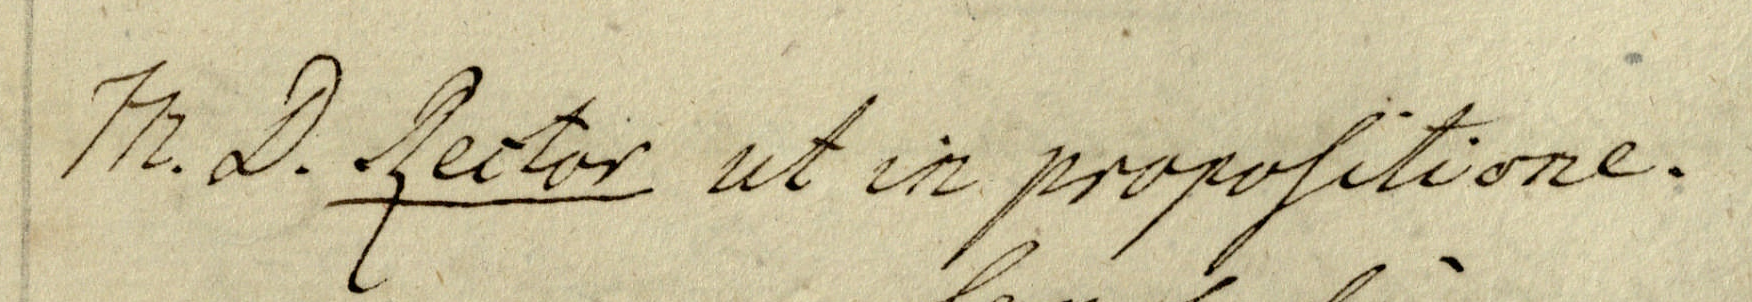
M. D. Rector ut in propositione.
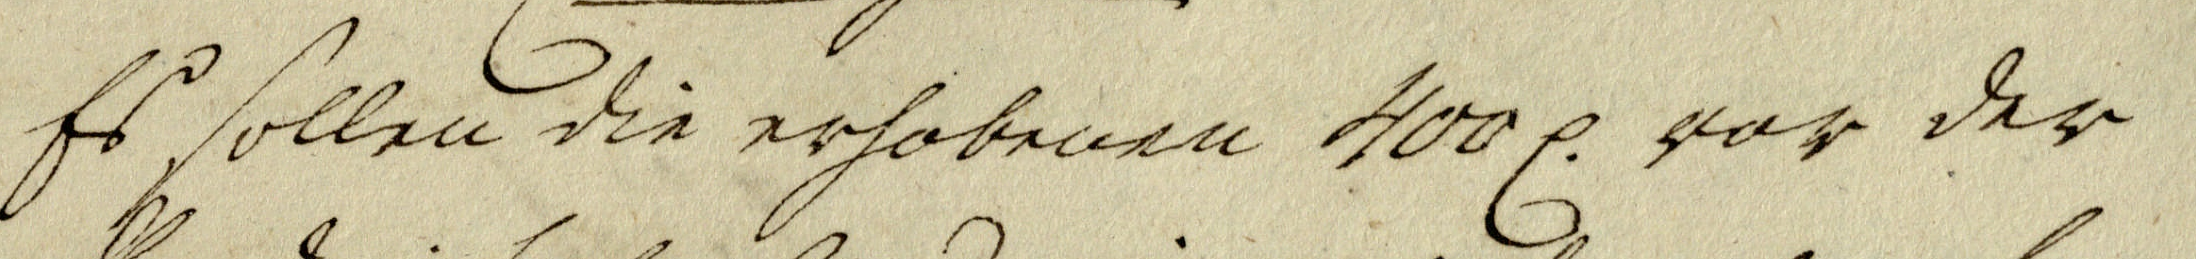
Es sollen die erhobenen 400 l. vor der
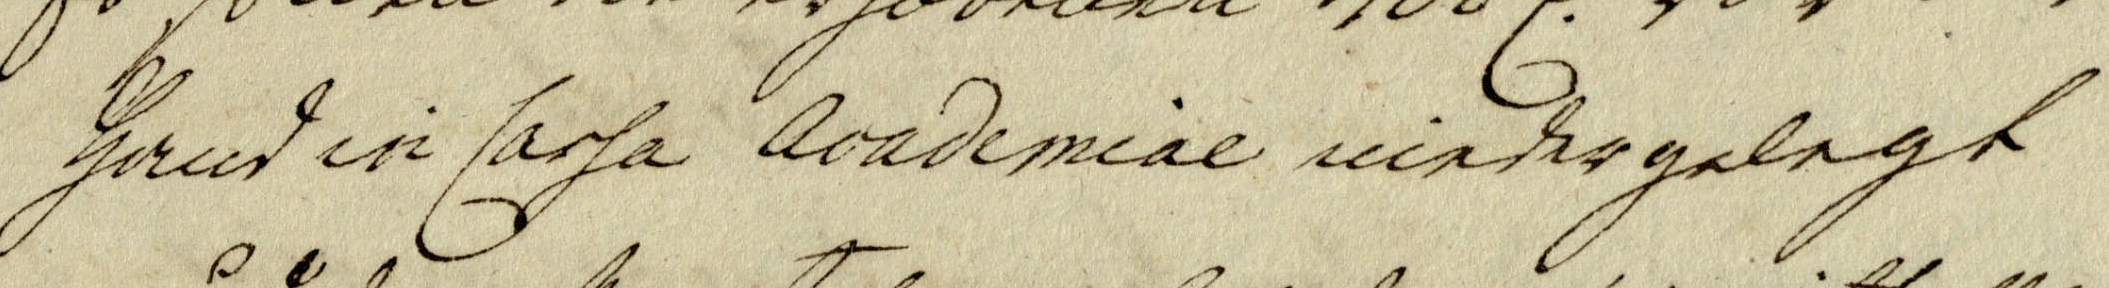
Hand in Cassa Academiae niedergelegt
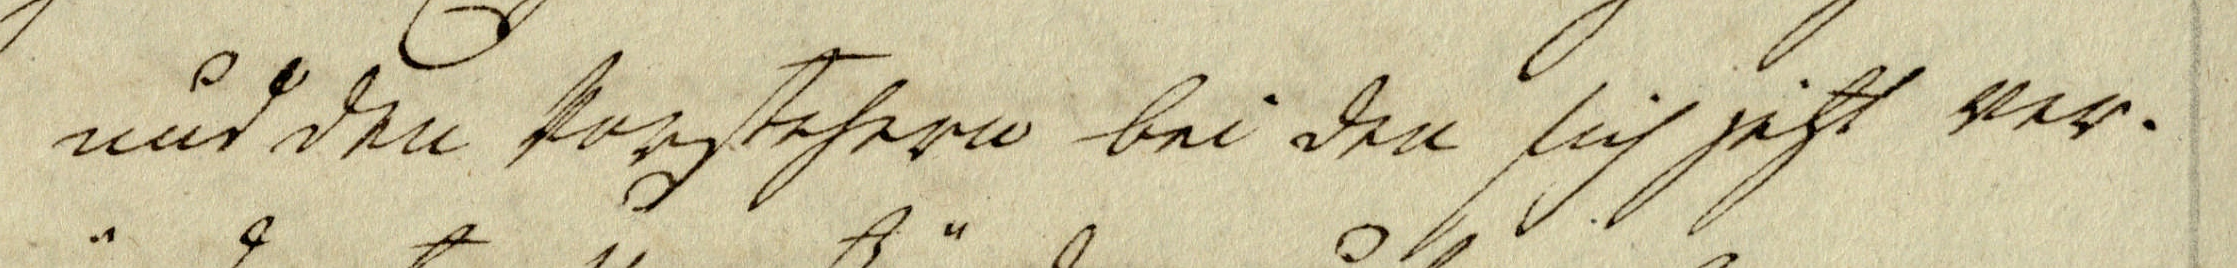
und den Vorstehern bei den sich jetzt ver¬
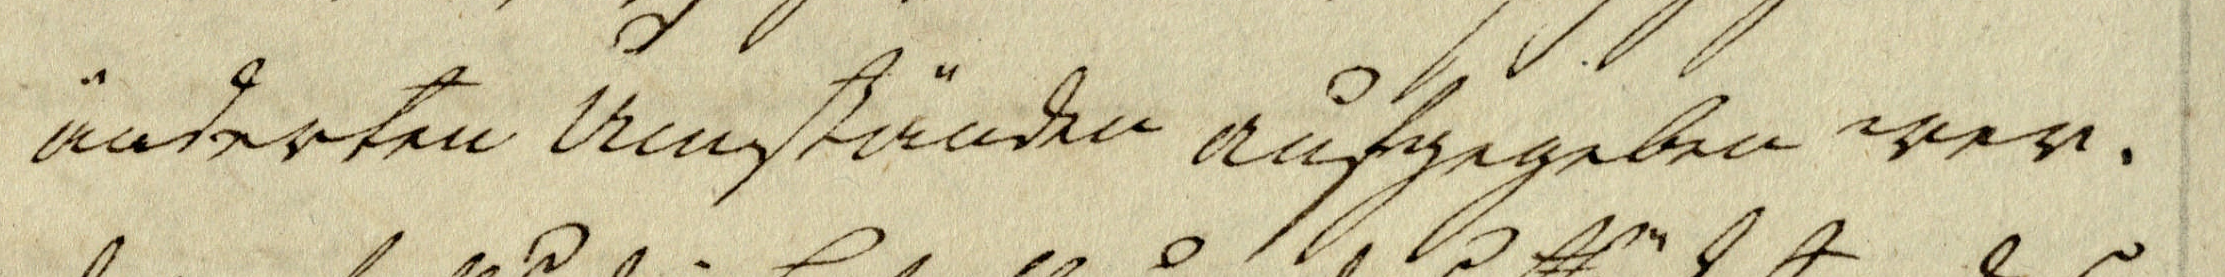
änderten Umständen aufgegeben wer¬
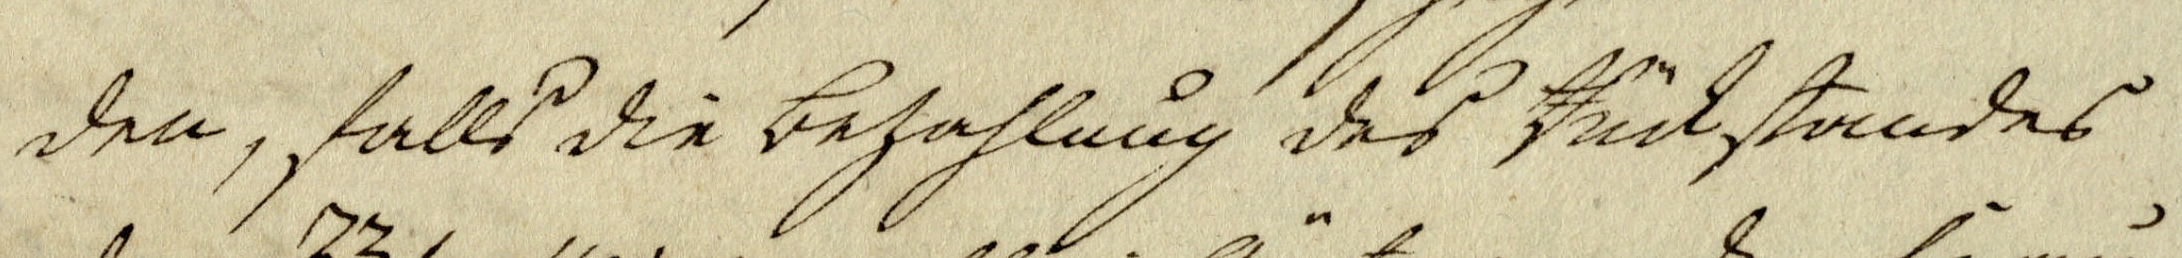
den, falls die Bezahlung des Rückstandes
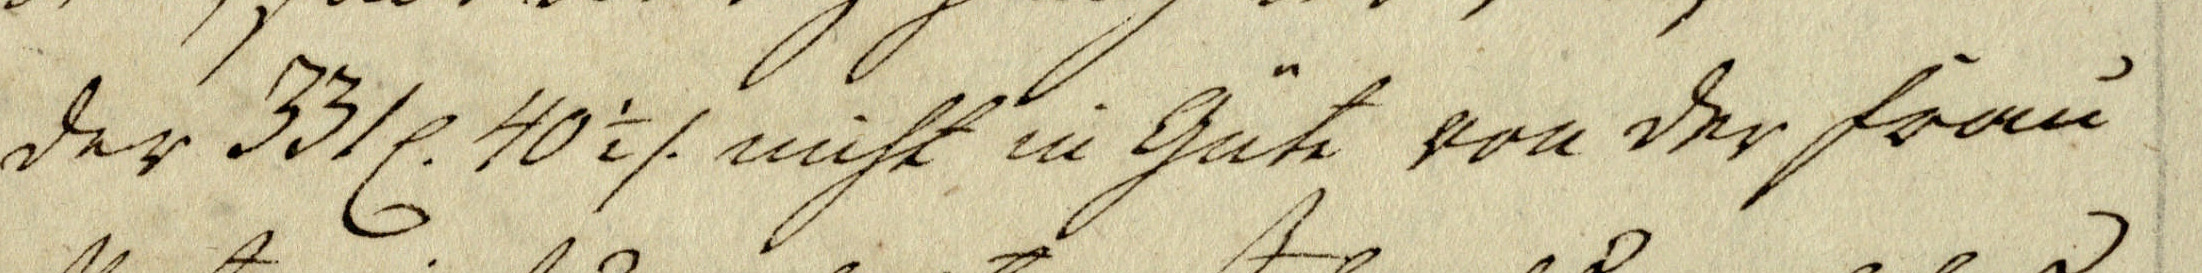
der 331 l. 40 ½ s. nicht in Güte von der Frau
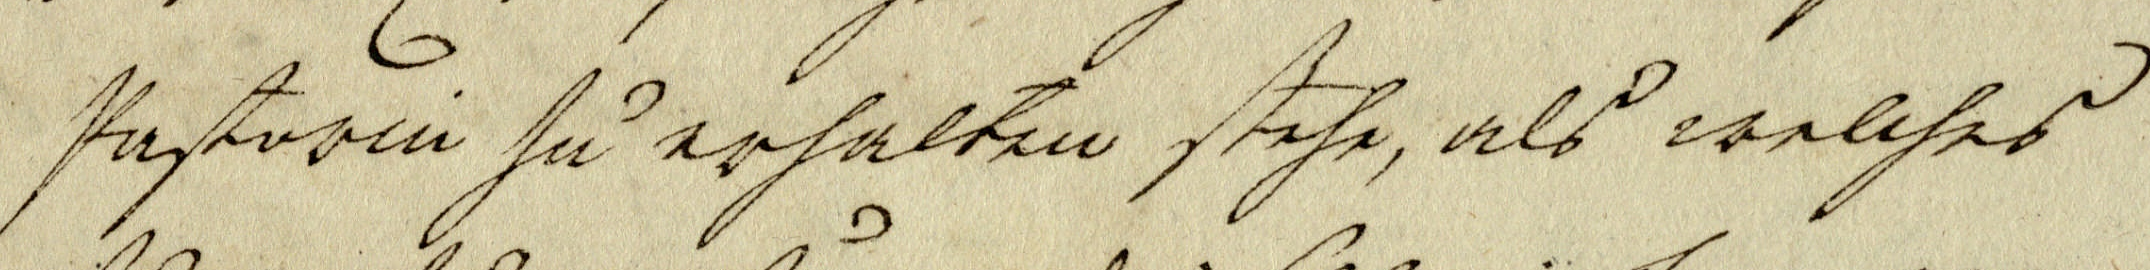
Pastor zu erhalten stehe, als welches
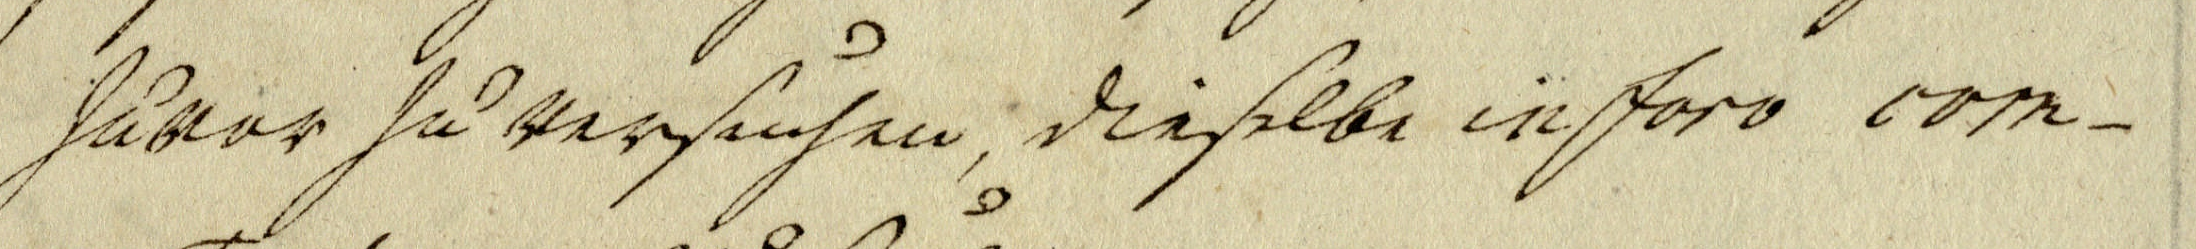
zuvor zu versuchen, dieselbe inforo com¬
